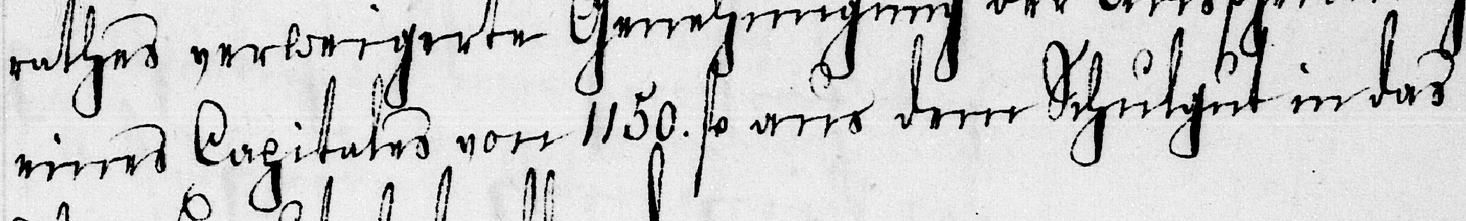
eines Capitals von 1150. fl. aus dem Schulgut in das
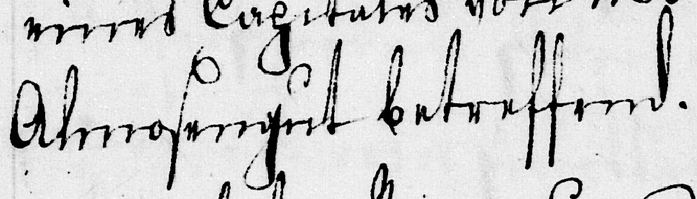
Almosengut betreffend.
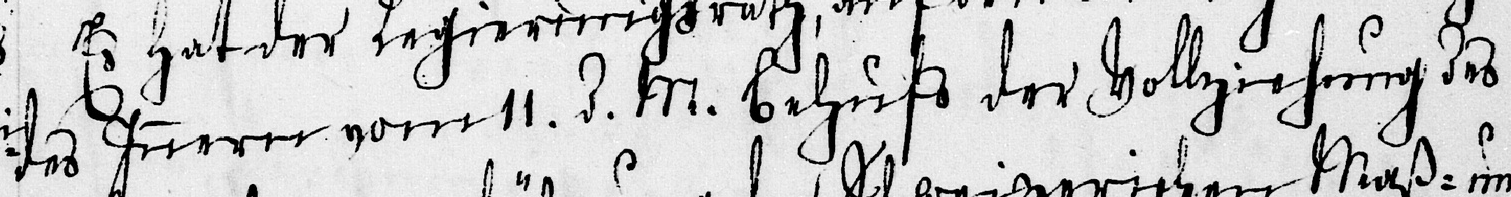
des Innern vom 11. d. M. Behufs der Vollziehung des
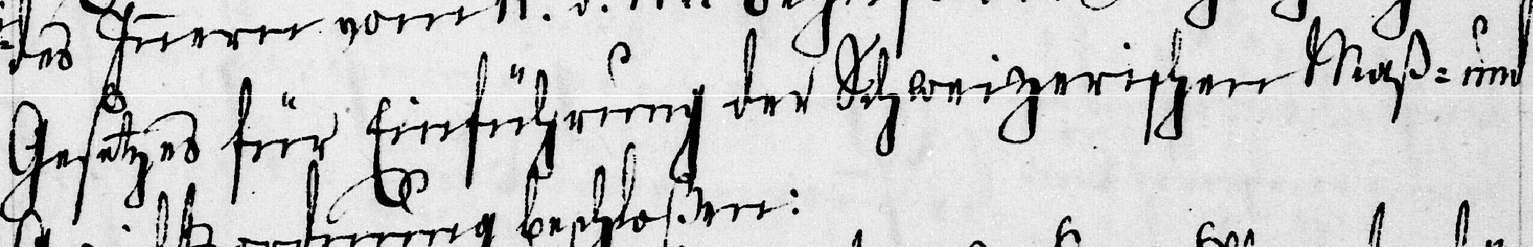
Gesetzes für Einführung der Schweizerischen Maß- und
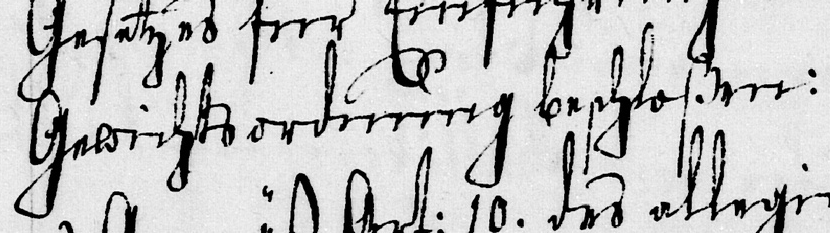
Gewichtsordnung beschloßen:
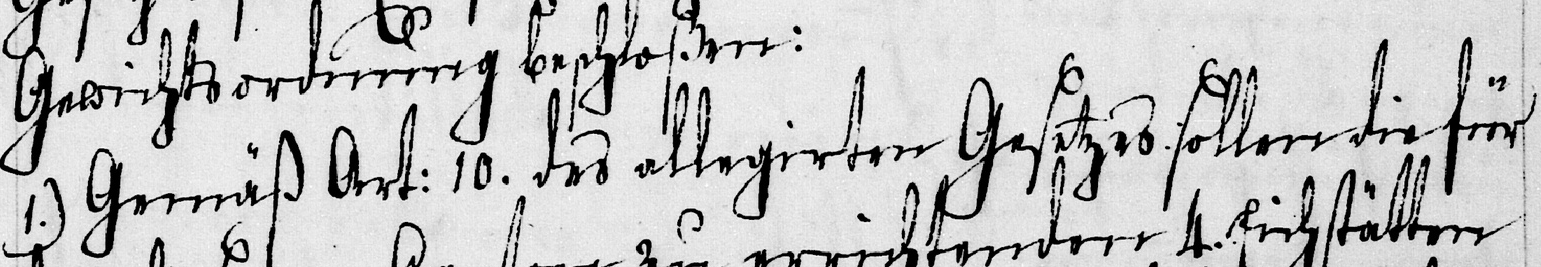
1.) Gemäß Art. 10. des allegirten Gesetzes sollen die für
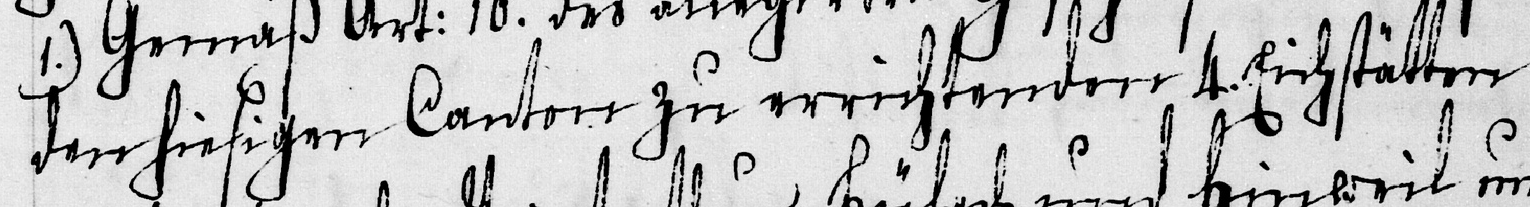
den hiesigen Canton zu verrichtenden 4. Eichstätten
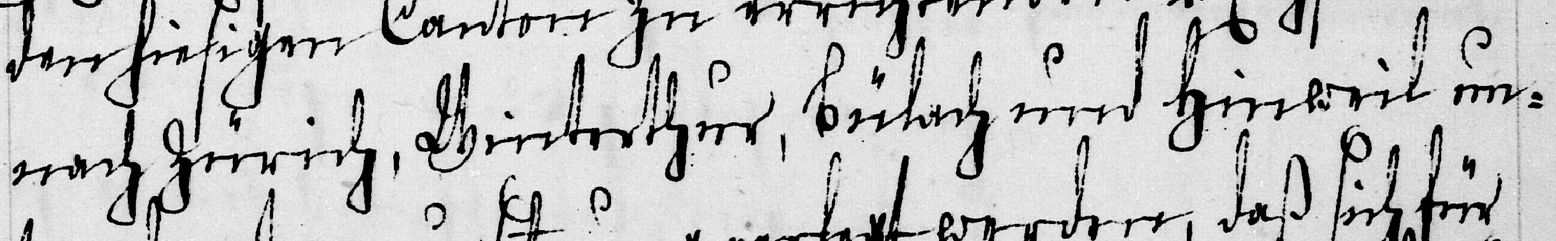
nach Zürich, Winterthur, Bülach und Hinwil un¬
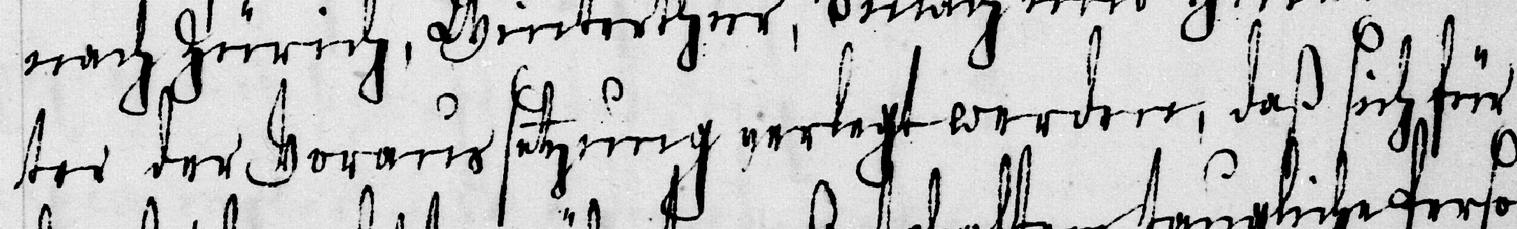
ter der Voraussetzung verlegt werden, daß sich für
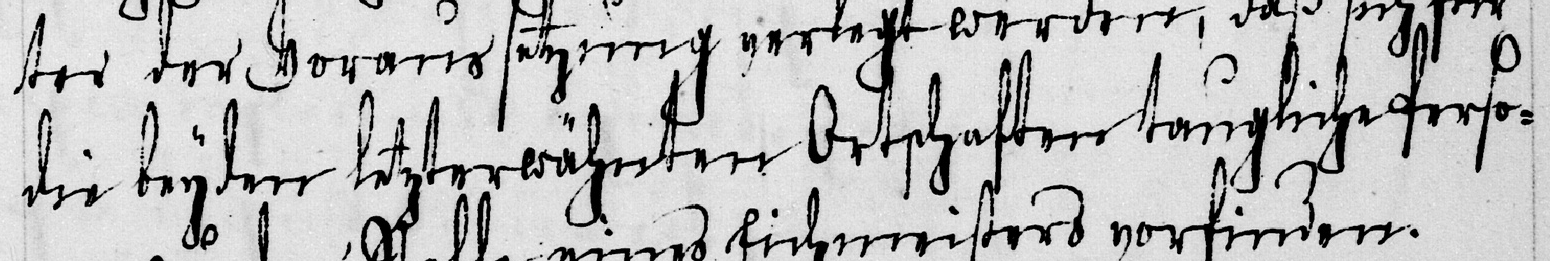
die beyden letzterwähnten Ortschaften taugliche Perso¬
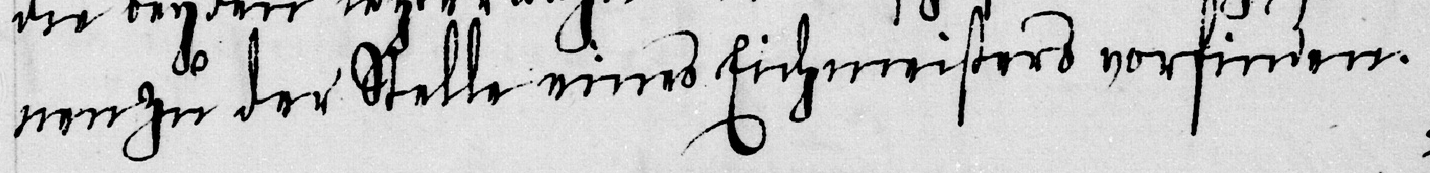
nen zu der Stelle eines Eichmeisters vorfinden.
